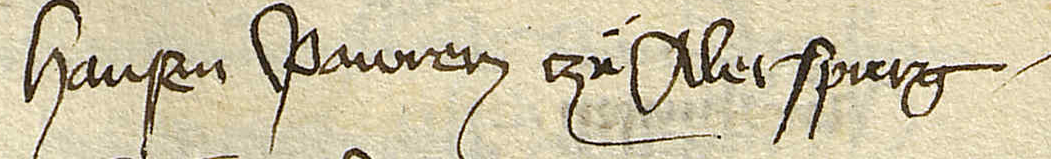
hanſen Pawren cʒü Alerſperg /
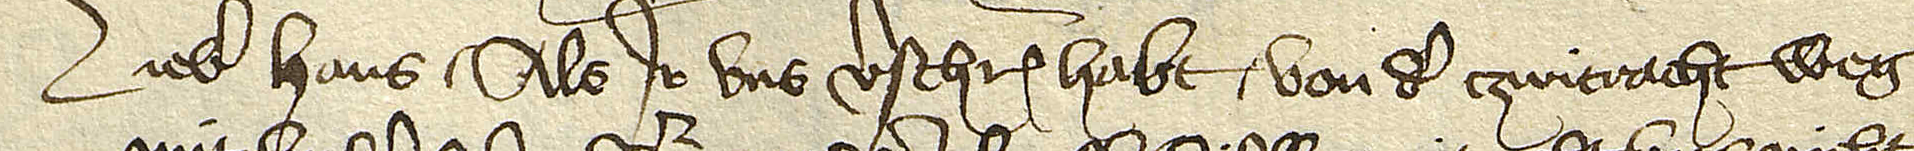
Lieb* hans / Als Ir vns v*ſchr* habt / von d* cʒwitracht weg*
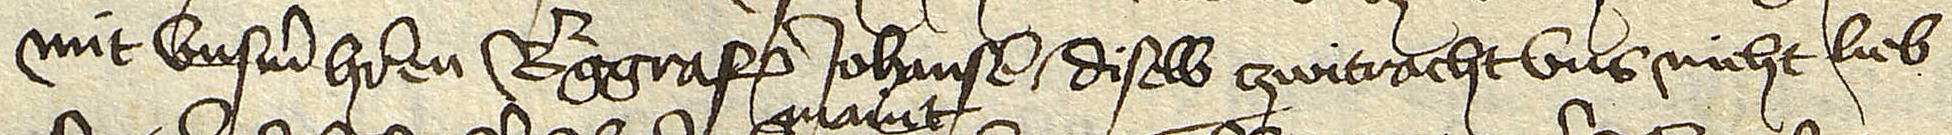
mit vnſm* hr*en B*ggraf* Iohanſe* / diſelb* cʒwitracht vns nicht lieb
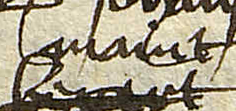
maint
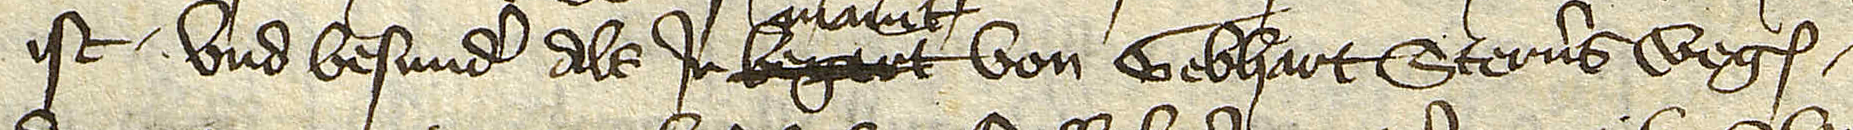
iſt / vnd beſund* als Ir begert von Gebhart Stern*s weg* /
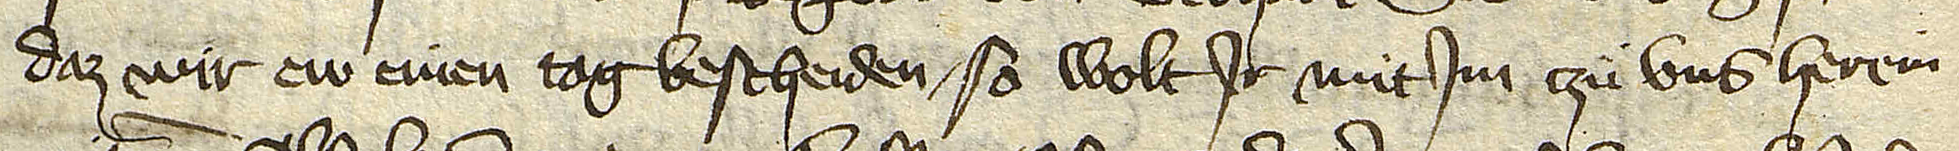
daʒ wir ew einen tag beſcheiden / ſo wolt Ir mit Im cʒü vns herein
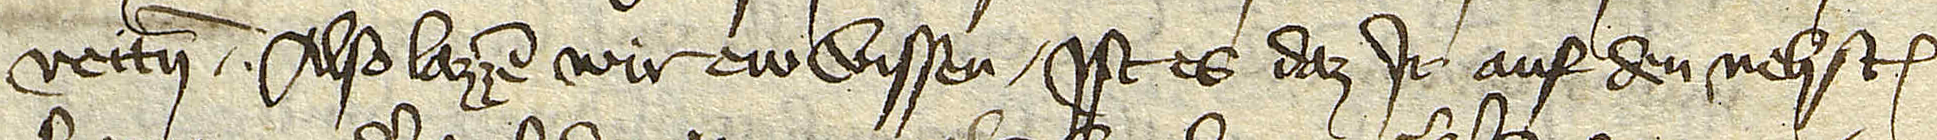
reitn* / . Alſo laʒʒe* wir ew wiſſen / Iſt es daʒ Ir auf den nehſt*
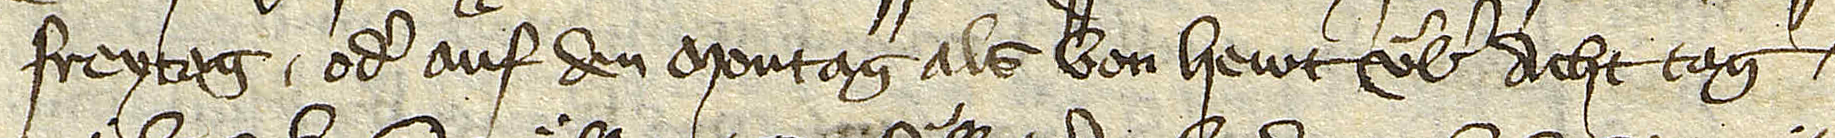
freytag / od* auf den Montag als von hewt v̈b* Acht tag /
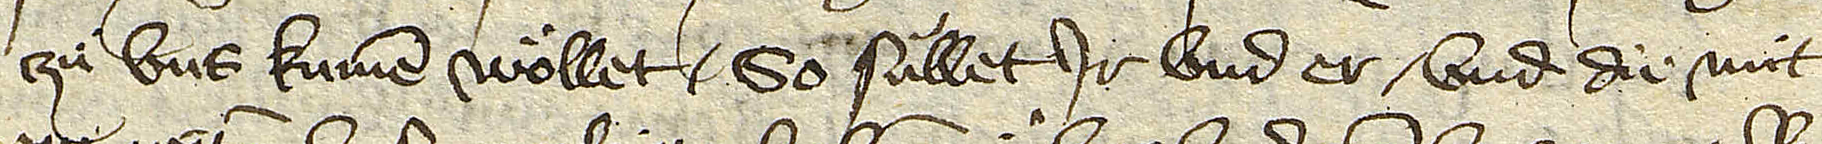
cʒü vns kume* wöllet / So ſüllet Ir vnd er / vnd die mit
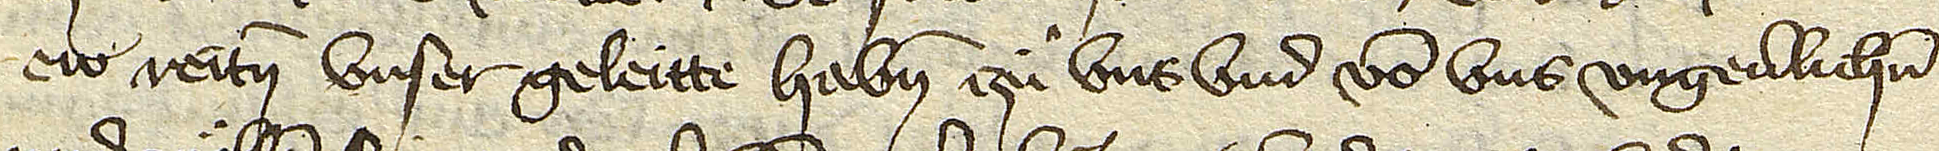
ew reitn* vnſer geleitte habn* cʒü vns vnd vo* vns vngeu*lichn*
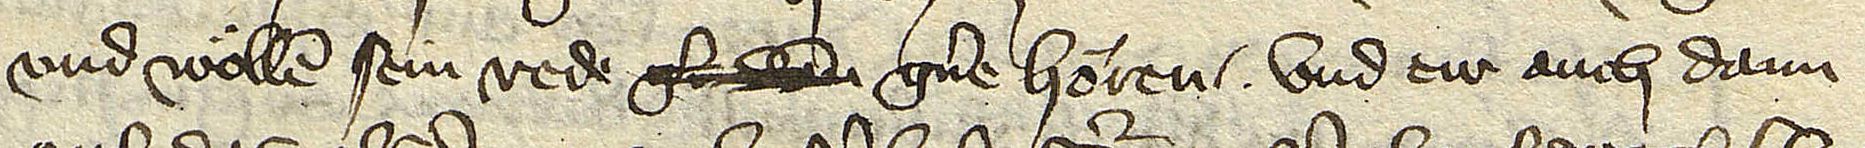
vnd wölle* ſein rede gn* dan* gn*e hören / . vnd ew auch dann
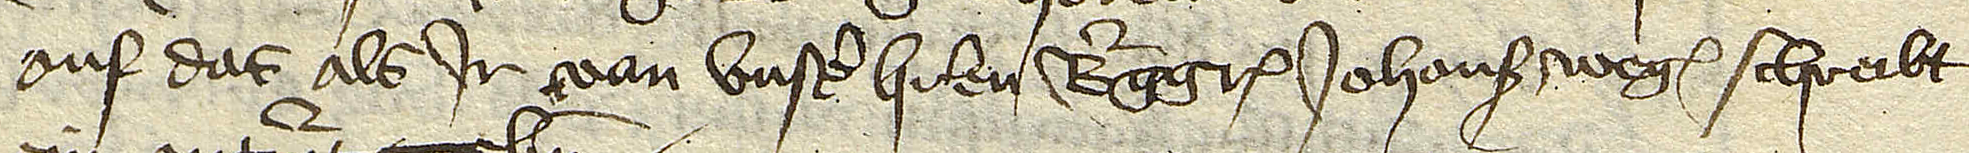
auf das als Ir von vnſs* hr*en B*ggr* Iohanſ* weg* ſchreibt
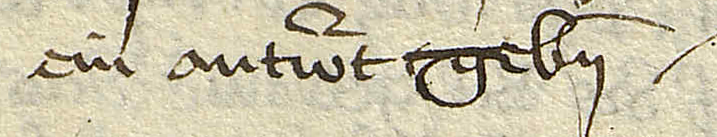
ein antw*t gebn* /
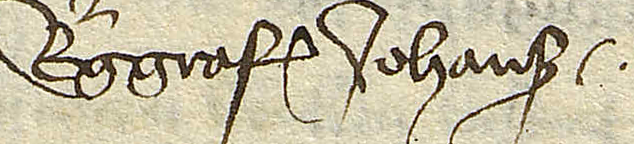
B*ggraf* Iohanſ* / .
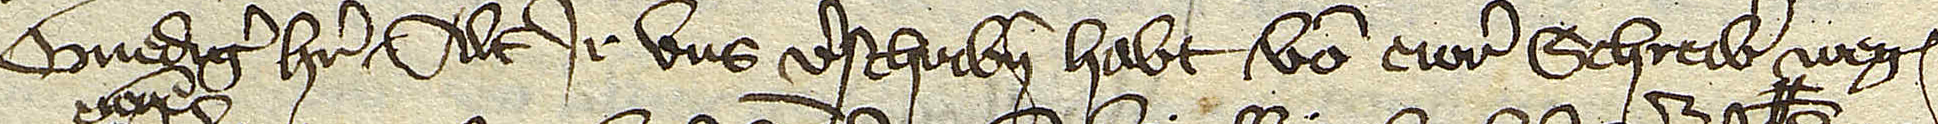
Gnedig* hr* / Als Ir vns v*ſchribn* habt / vo* ewr* Schreib* weg*
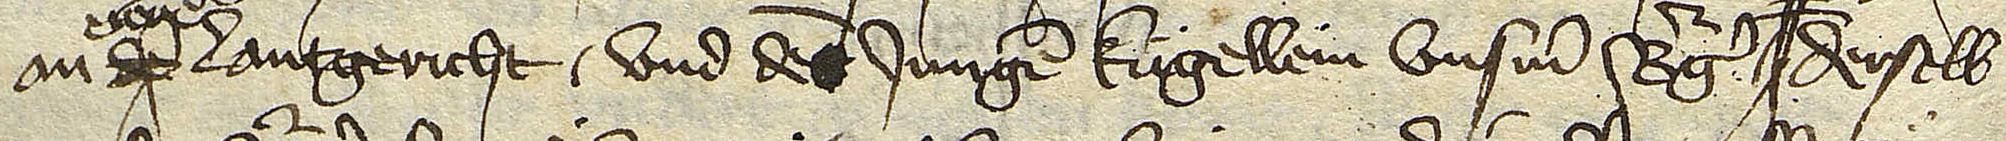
an de* Lantgericht / vnd des* Iunge* kügellein vnſm* B*g* derſelb
